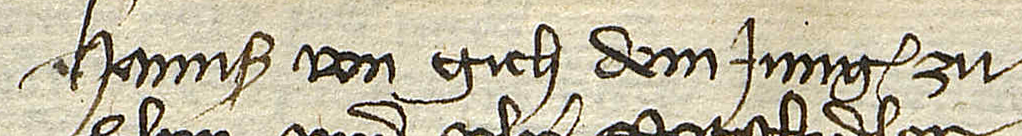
Hannſ* von gich dem Iung* ʒu
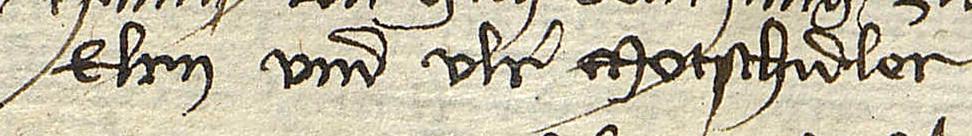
Elrn vnd vlr* Motſchidler
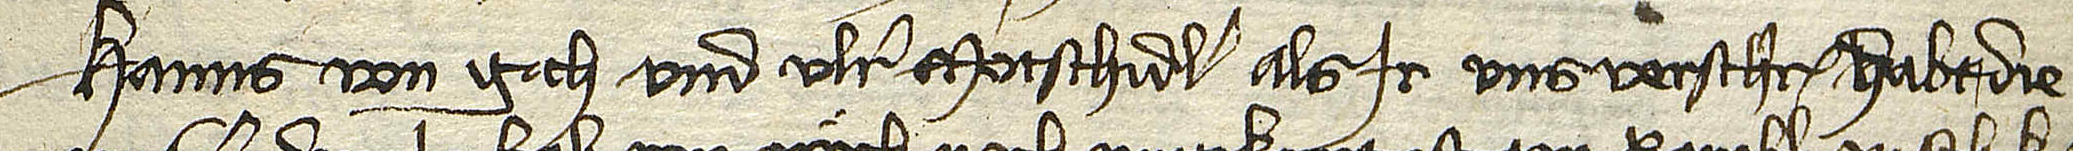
Hanns von gich vnd vlr* Motſchidl* als Ir vns verſchr* habt die
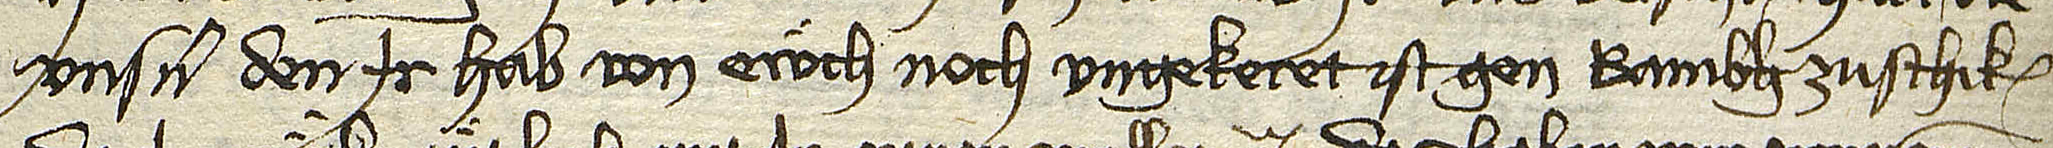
vnſn* den Ir hab von ewch noch vngekeret iſt gen Bamb*g ʒu ſchik*
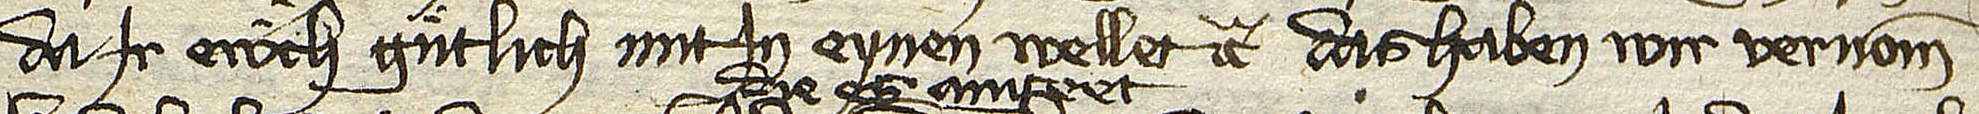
da Ir ewch gütlich mit In eynen wellet ec* das haben wir vernom*
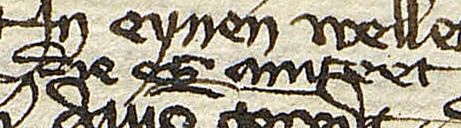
die es angeet
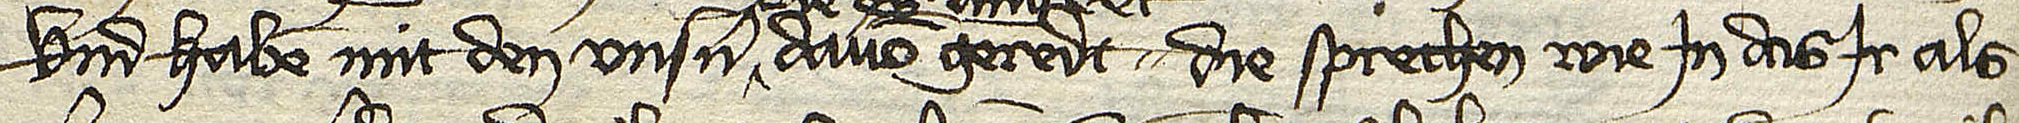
Vnd habe* mit den vnſ*n dauo* geredt / die ſprechen wie In das Ir als
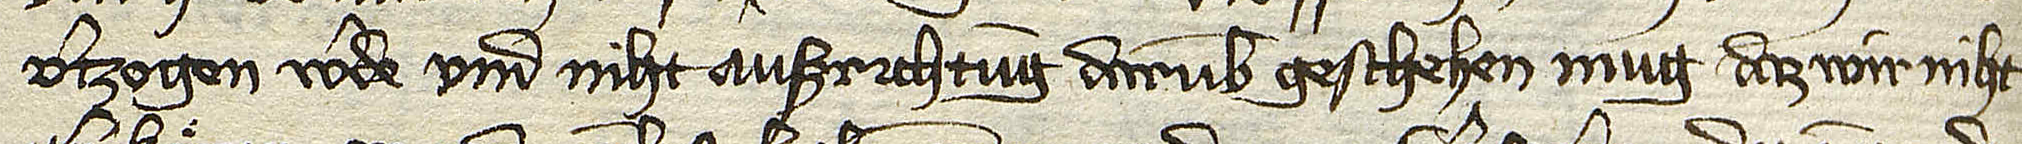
v*cʒogen w*de vnd niht auſʒrichtug* darub* geſchehen mug / daʒ wir niht
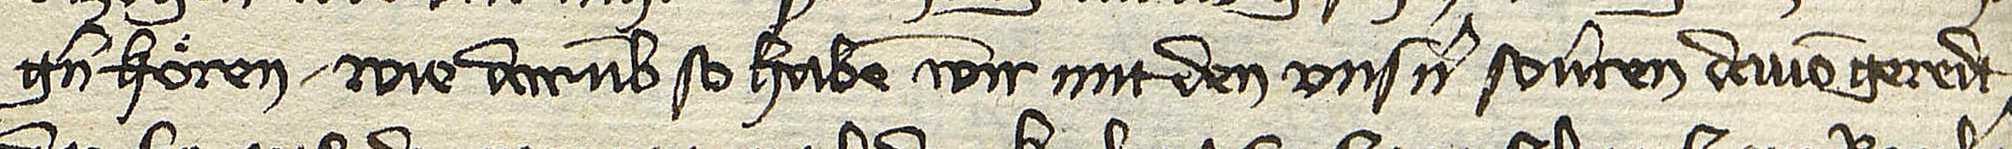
gn* hören / wie darub* ſo habe* wir mit den vnſn* ſou*ren dauo* geredt
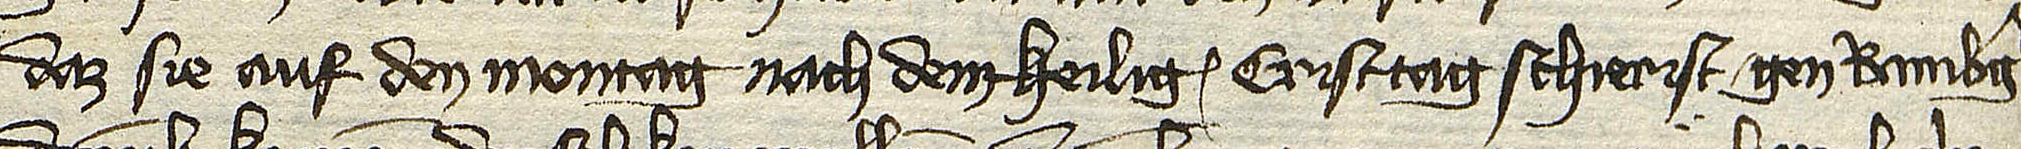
daʒ ſie auf den montag nach dem heilig* Criſttag ſchieriſt / gen Bambg*
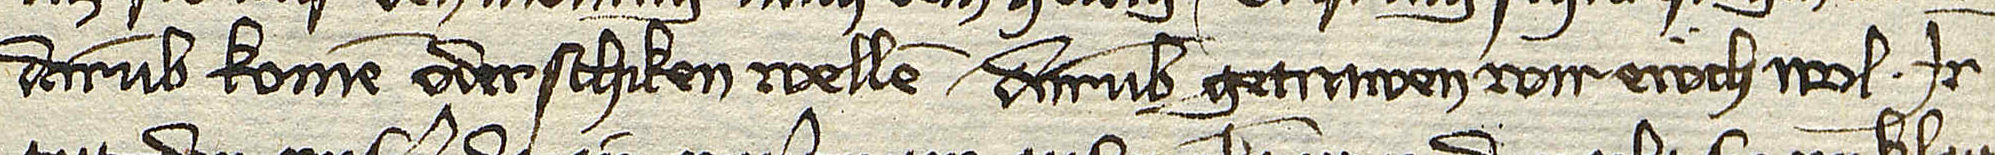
darub* kome* oder ſchiken welle* / Darub* getrawen wir ewch wol . Ir
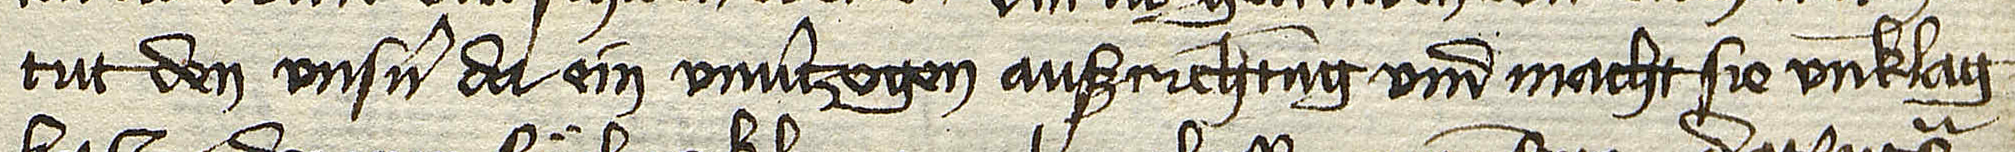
tut den vnſn* da ein vnu*cʒogen auſʒrichtu*g vnd macht ſie vnklag =
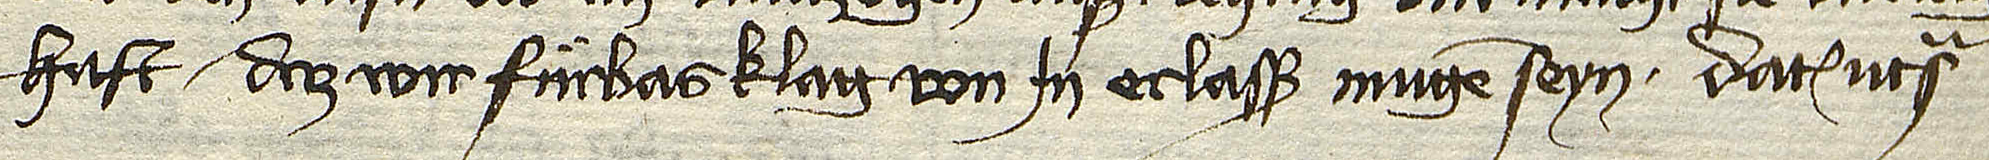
haft / daʒ wir fürbas klag von In erlaſſ* muge* ſeyn / dat* ut ſ*
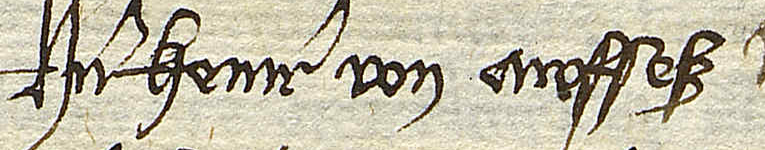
Hn* heinr* von Awfſeſʒ
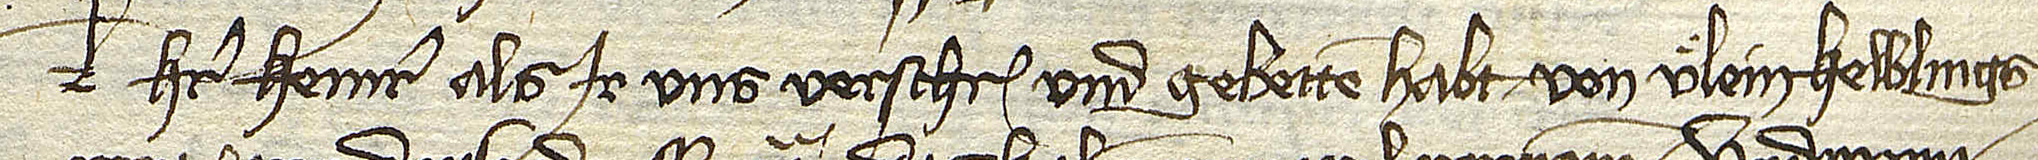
L* hr* heinr* als Ir vns verſchr* vnd gebette* habt / von v̈lein helblings
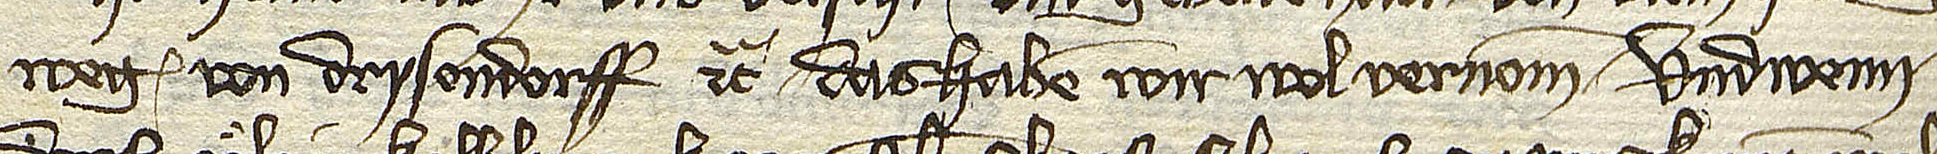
weg* von dryſendorff ec* / das habe* wir wol vernom* / Vnd wenn
